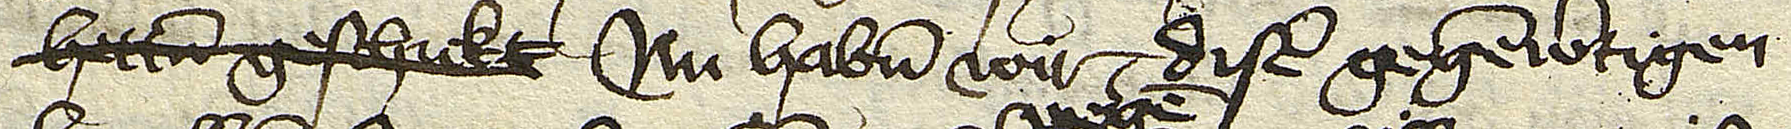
hettn* geſchickt Nu habn* wir / diſe* geg*w*tigen
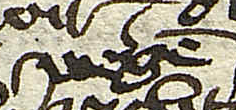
wege*
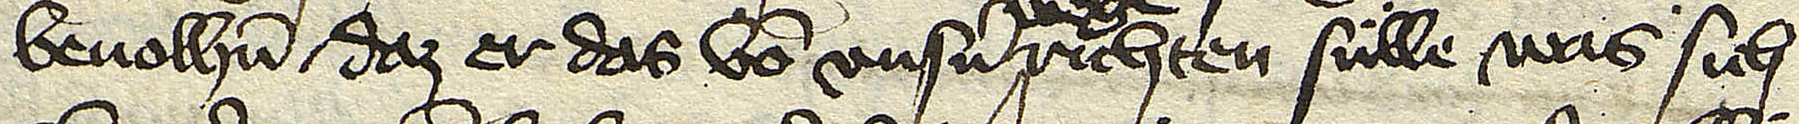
beuolhn* / daʒ er das vo* vnſn* richten ſülle was ſich
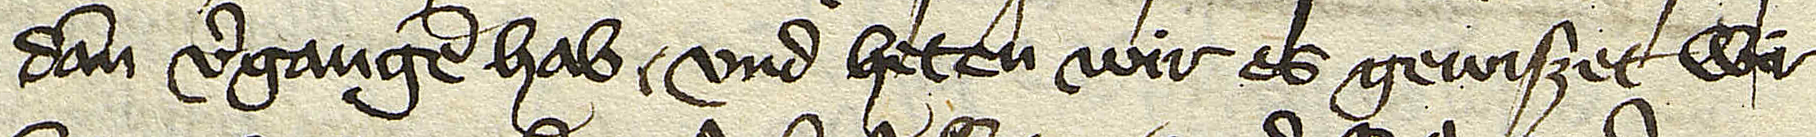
dan* v*gange* hab / vnd heten wir es gewiſʒet wir
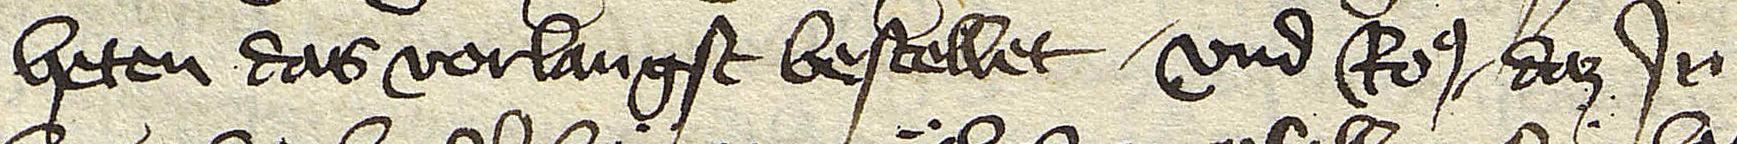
heten das vorlangſt beſtellet / vnd Ro* / daʒ Ir
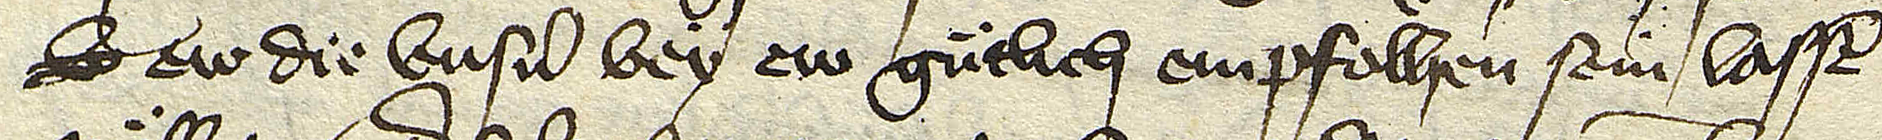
vo ew die vnſn* bey ew gütlich empfolhen ſein laſſe*
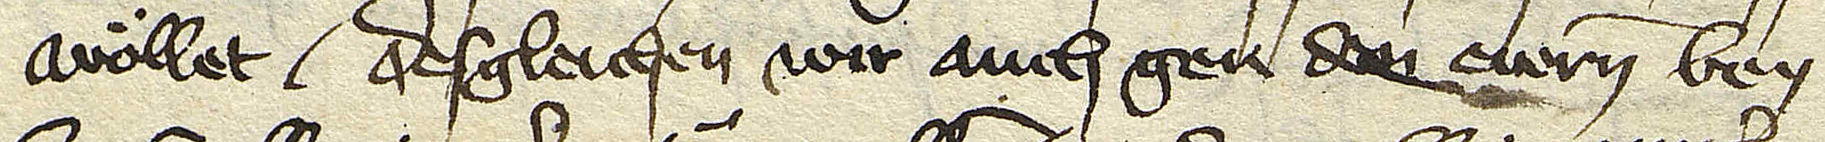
wöllet / Deſgeleichen wir auch gen den ewrn* bey
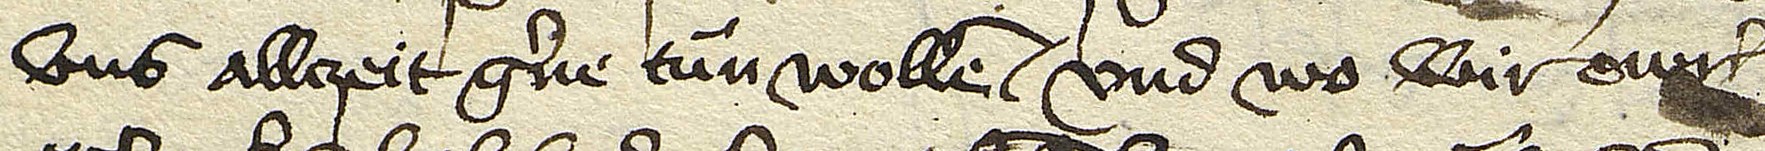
vns allcʒeit g*ne tün wolle* / vnd wo wir ewr*
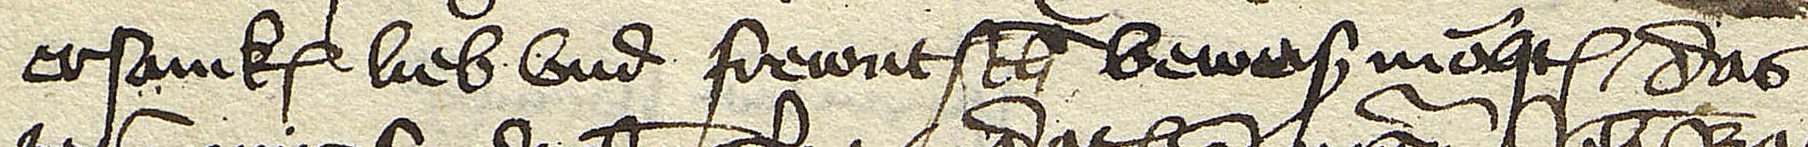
erſamk* llieb vnd frewntſch* beweiſ* möht* / Das
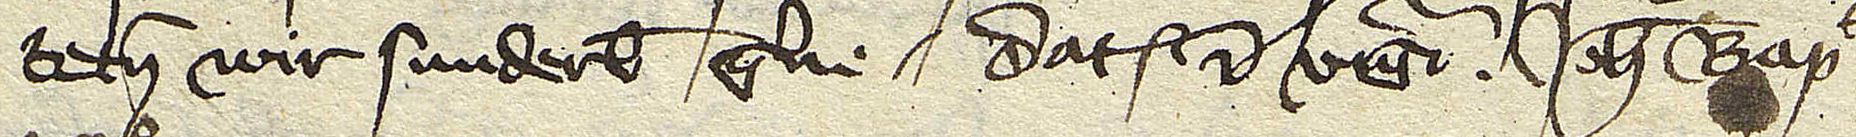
tetn* wir ſunderl* g*ne / Dat* i* vigi* . Ioh* Bap* .
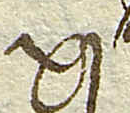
xi*
